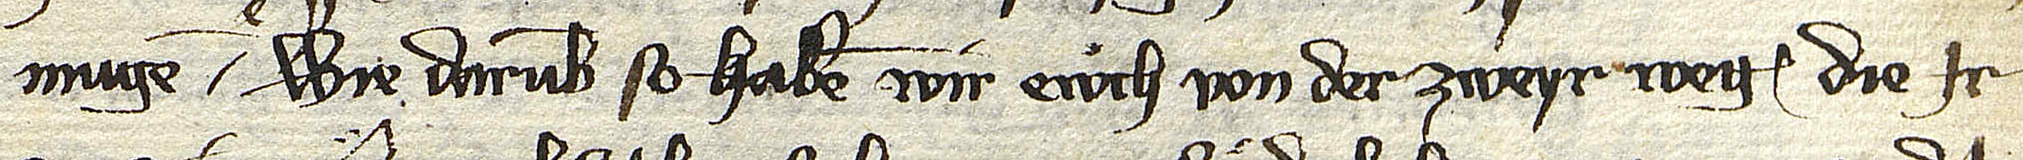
muge* / Wie daru*b ſo habe* wir ewch von der ʒweyr weg* die Ir
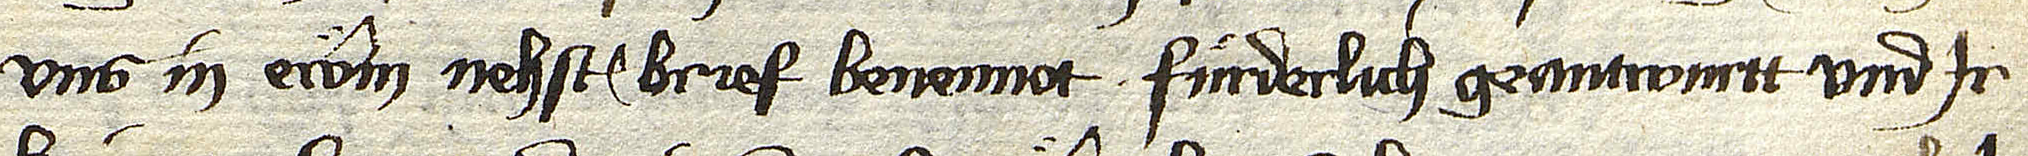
vns in ew*n nehſt* brief benennot . fürderlich geantwurtt vnd Ir
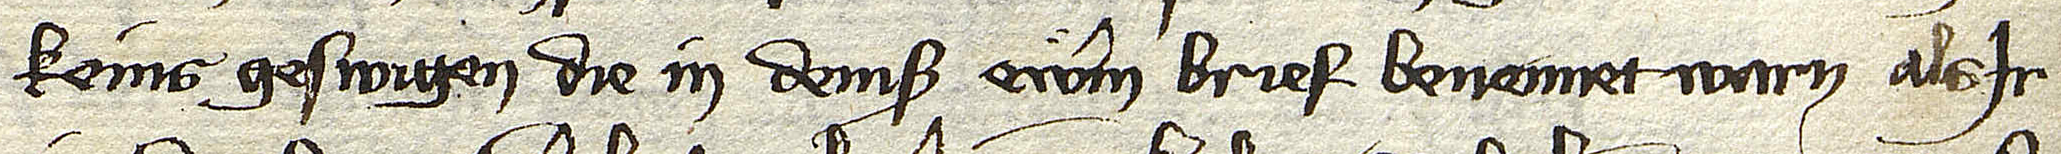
keins geſwigen die in demſ* ew*n brief benennet warn als Ir
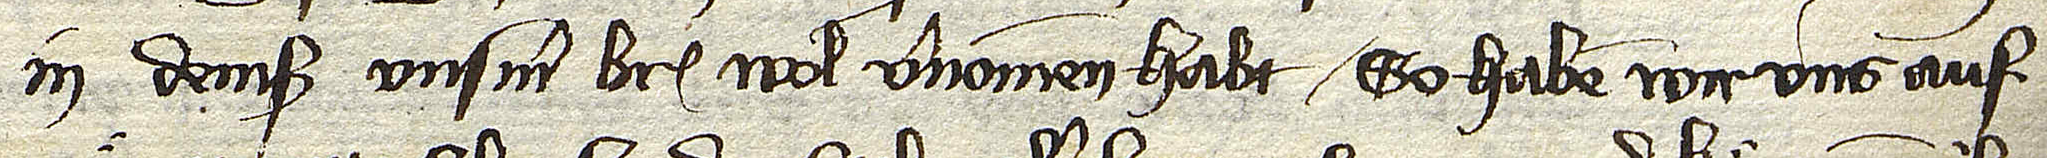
in demſ* vnſ*m br* wol v*nom*en habt / So habe* wir vns auf
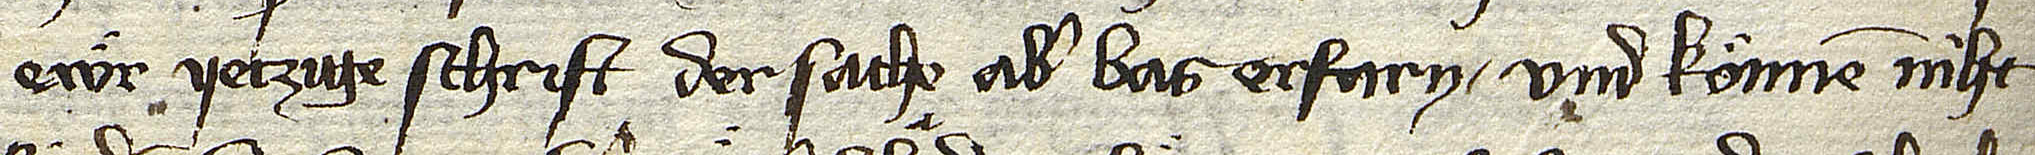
ewr yecʒige ſchrift der ſache ab* bas erfarn / vnd könne* niht
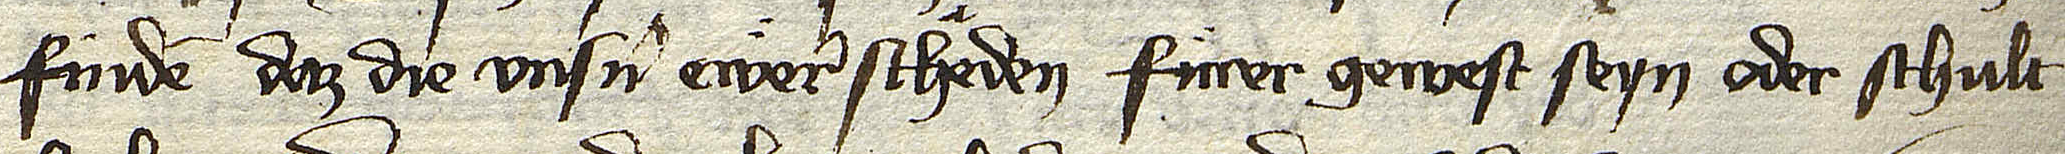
finde* daʒ die vnſ*n ewer* ſchëden fürer geweſt ſeyn oder ſchult
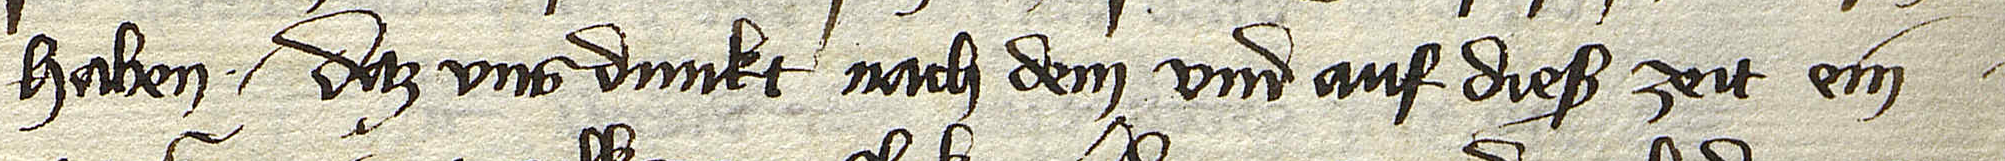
haben . / daʒ vns dunkt nach dem vnd auf dieſ* ʒeit ein
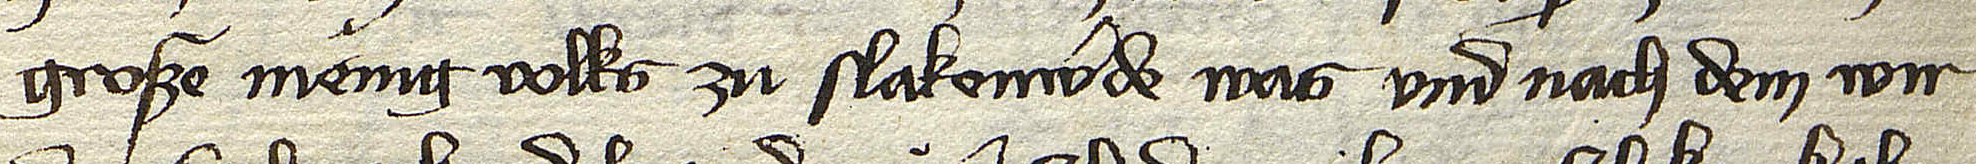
groſʒe mënig volks ʒu ſlakenw*de was vnd nach dem wir
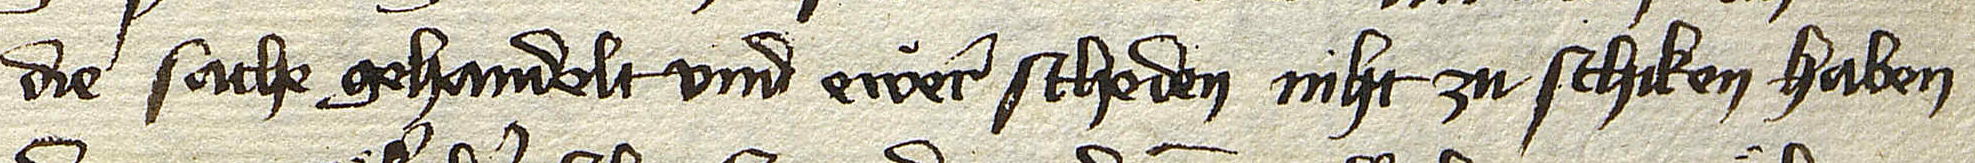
die ſache gehandelt vnd ewer* ſcheden niht ʒu ſchiken haben
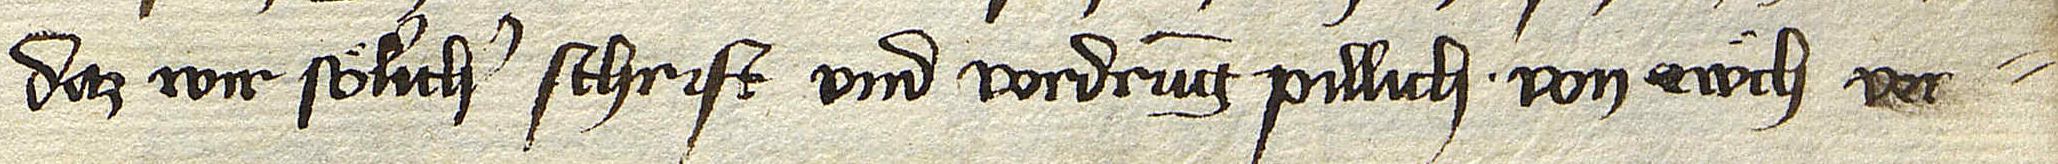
daʒ wir ſölich* ſchrift vnd vordru*g pillich . von ewch ver =
